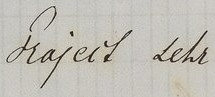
Project sehr
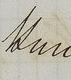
Herr
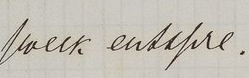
zweckentspre-
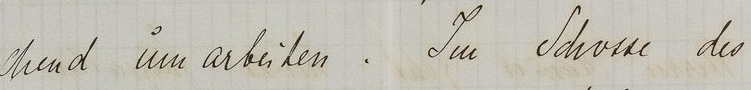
chend umarbeiten. Im Schosse des
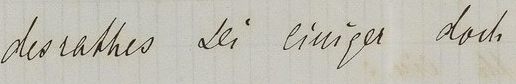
desrathes sei einiger doch
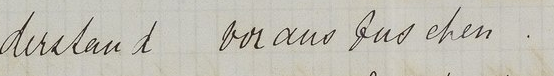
derstand vorauszusehen.
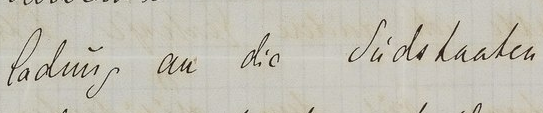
ladung an die Südstaaten
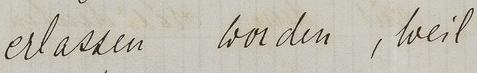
erlassen worden, weil
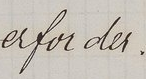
Angelegenheit
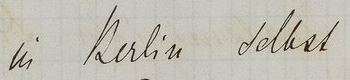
in Berlin selbst
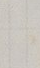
die
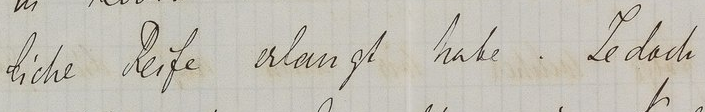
liche Reife erlangt habe. Jedoch
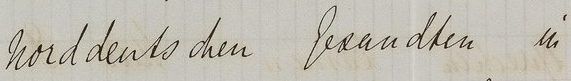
norddeutschen Gesandten in
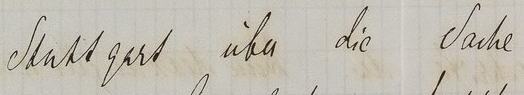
Stuttgart über die Sache
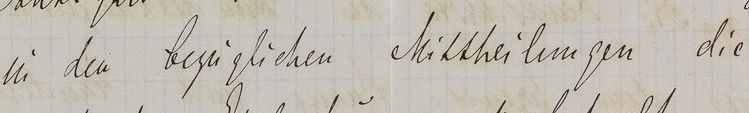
in den bezüglichen Mittheilungen die
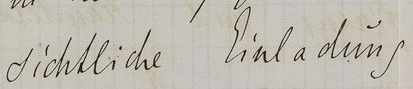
sichtliche Einladung
